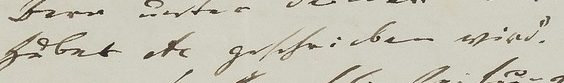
Huber etc geschrieben wird.
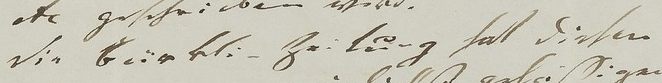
Die Bürkli-Zeitung hat diesen
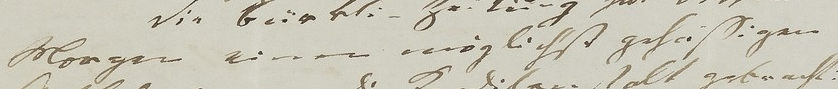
Morgen einen möglichst gehässigen
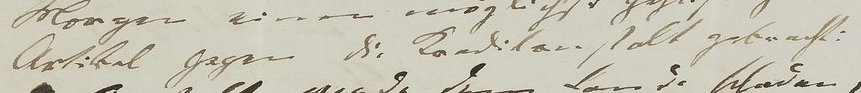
Artikel gegen die Kreditanstalt gebracht:
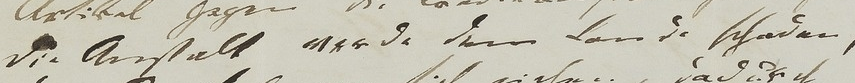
«Die Anstalt werde dem Lande schaden,
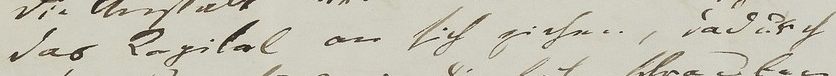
das Kapital an sich ziehen, dadurch
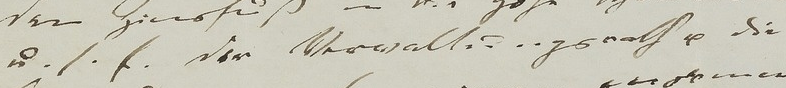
u. s. f. Der Verwaltungsrath & die
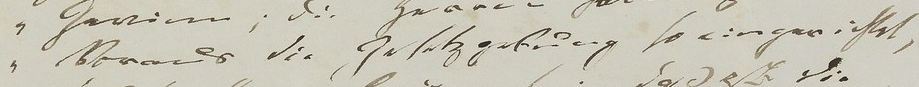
Voraus die Gesetzgebung so eingerichtet,
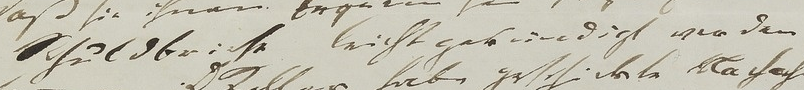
Schuldbriefe leicht gekündigt werden
